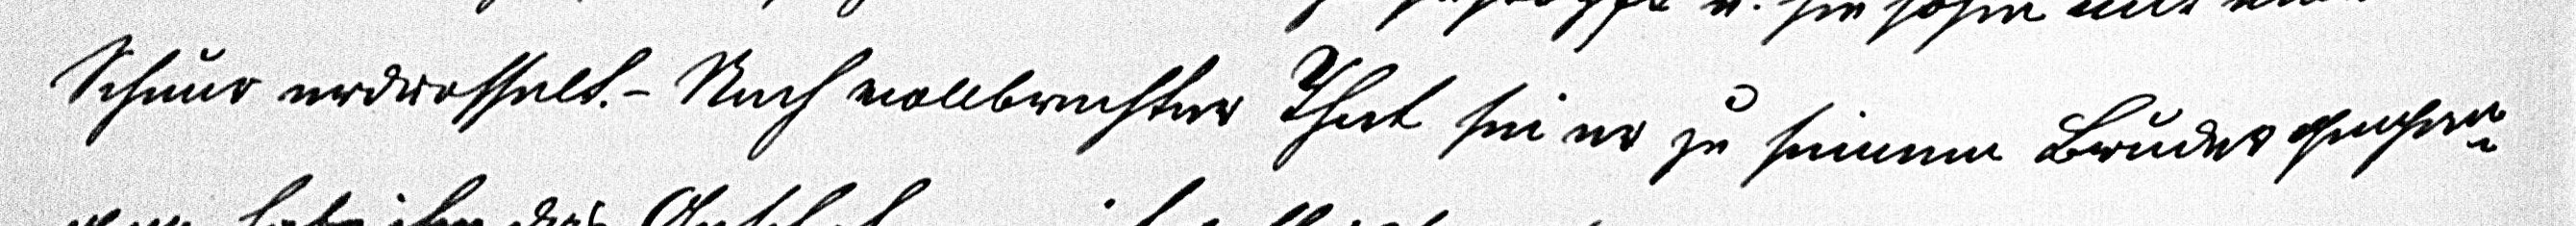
Schnur erdrosselt.- Nach vollbrachter That sei er zu seinem Bruder gegan¬
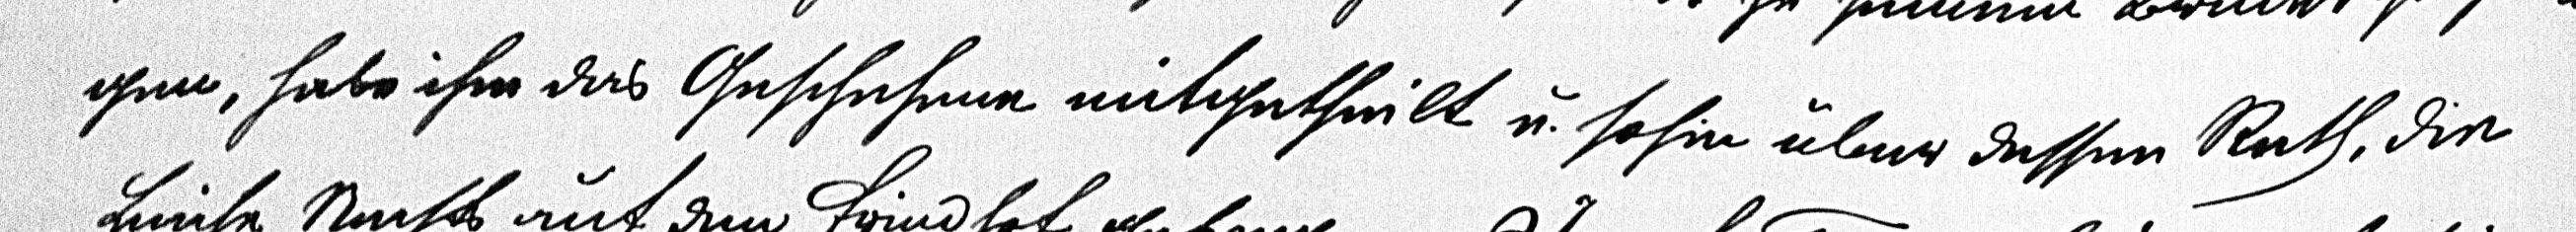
gen, habe ihm das Geschehene mitgetheilt u. sohin über dessen Rath, die
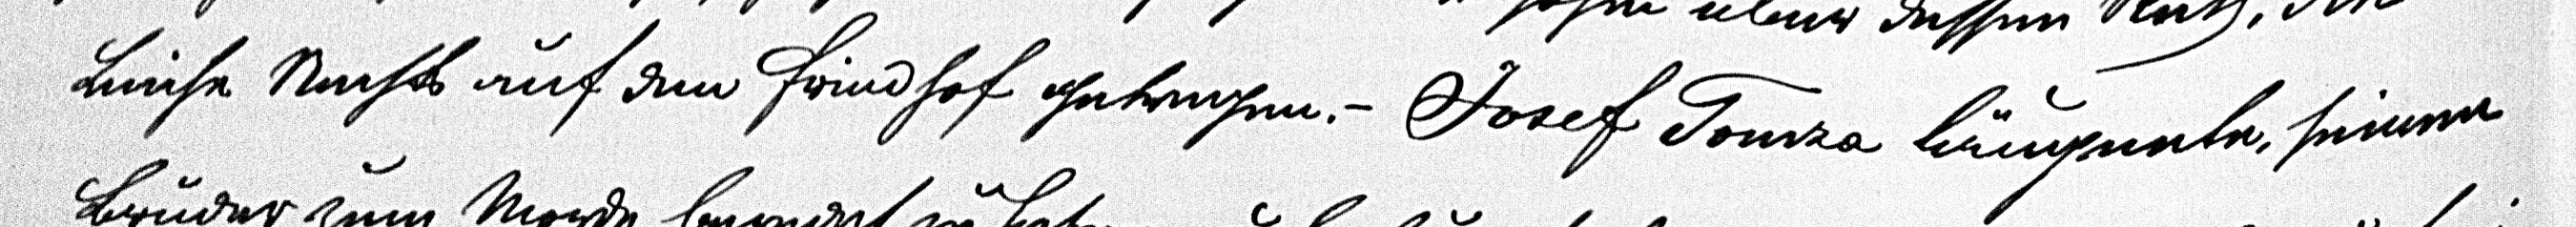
Leiche Nachts auf den Friedhof getragen.- Josef Tomza läugnete, seinen
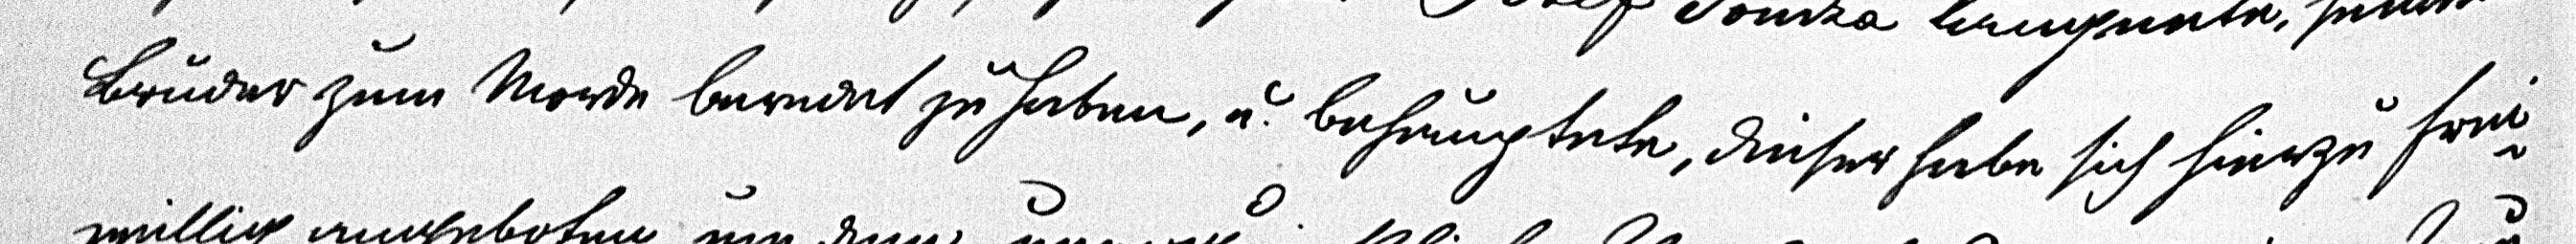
Bruder zum Morde beredet zu haben, u. behauptete, dieser habe sich hierzu frei¬
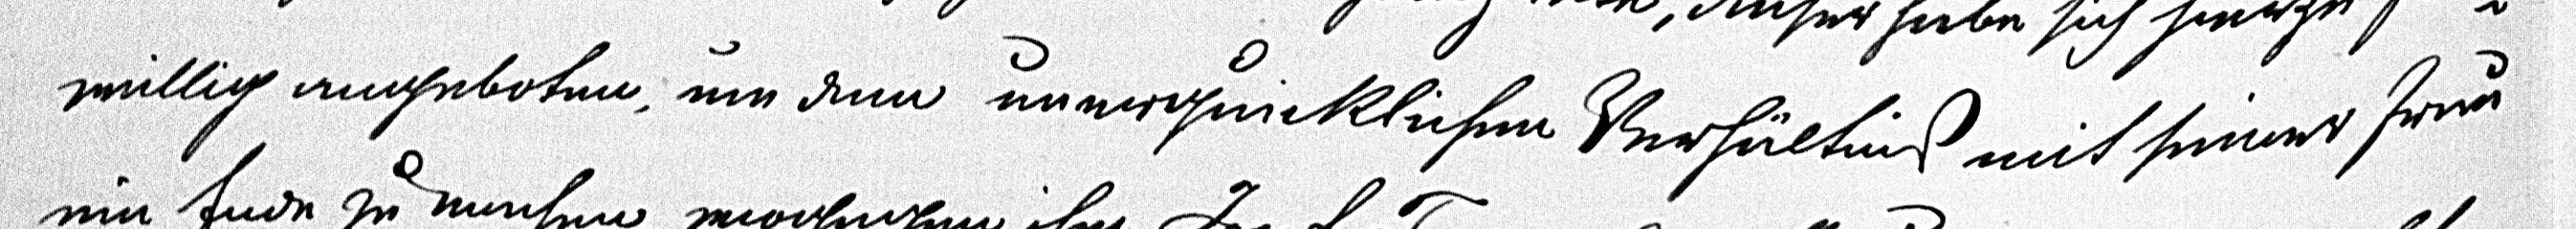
willig angeboten, um dem unerquicklichen Verhältnis mit seiner Frau
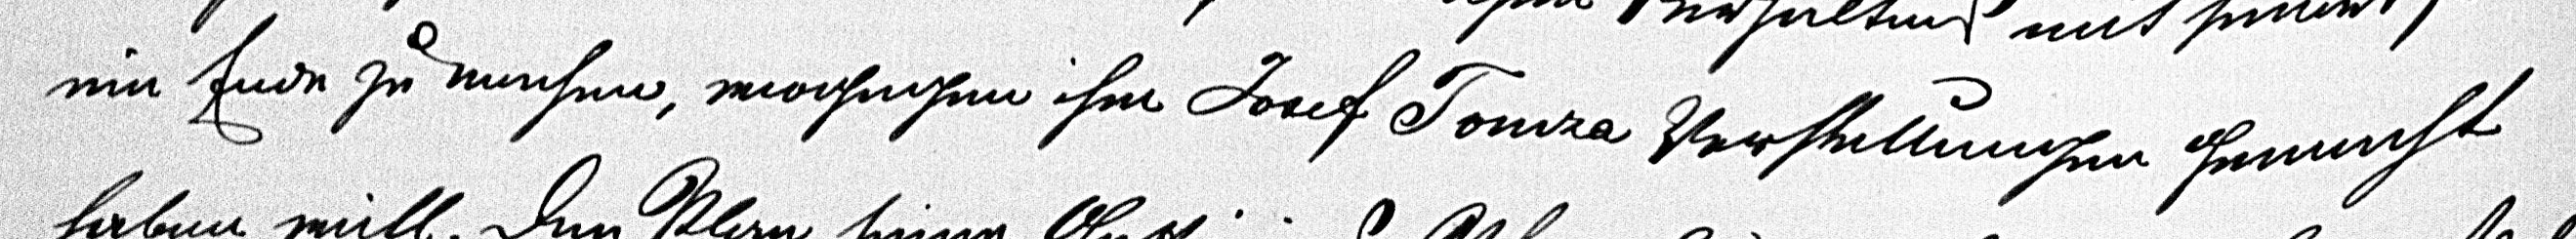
ein Ende zu machen, wogegen ihm Josef Tomza Vorstellungen Gemacht
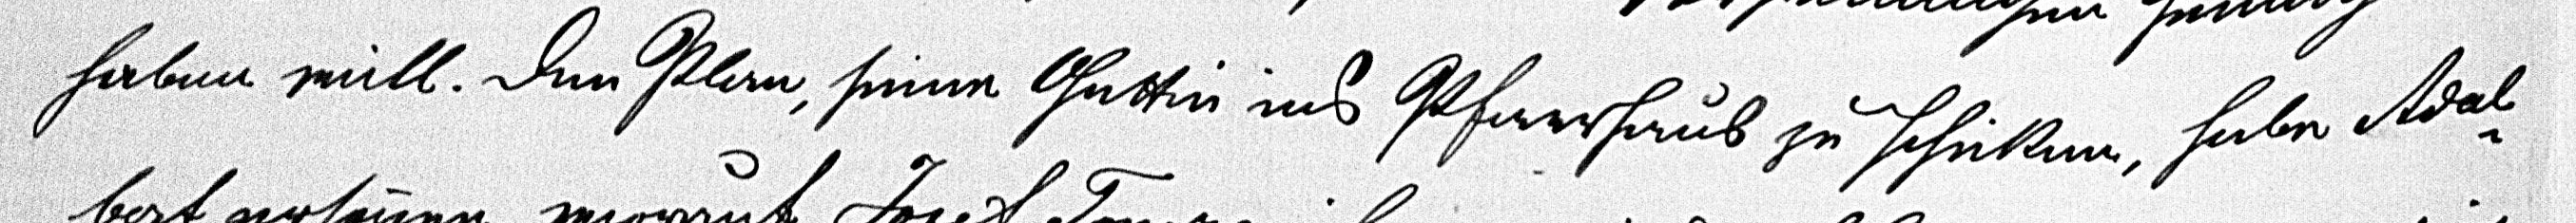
haben will. Den Plan, seine Gattin ins Pfarrhaus zu schicken, habe Adal¬
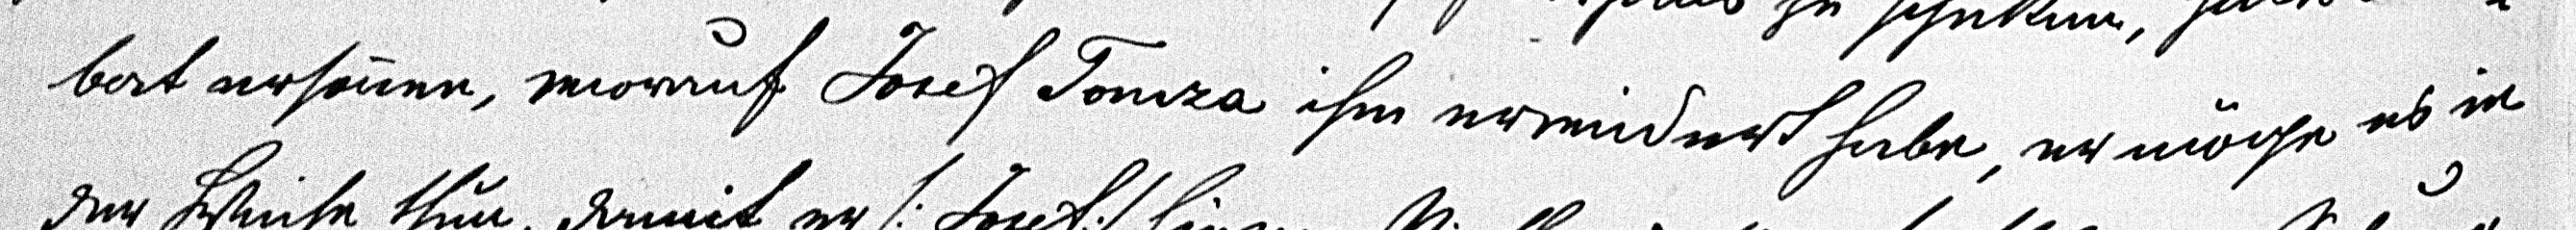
bert ersonnen, worauf Josef Tomza ihm erwidert habe, er möge es in
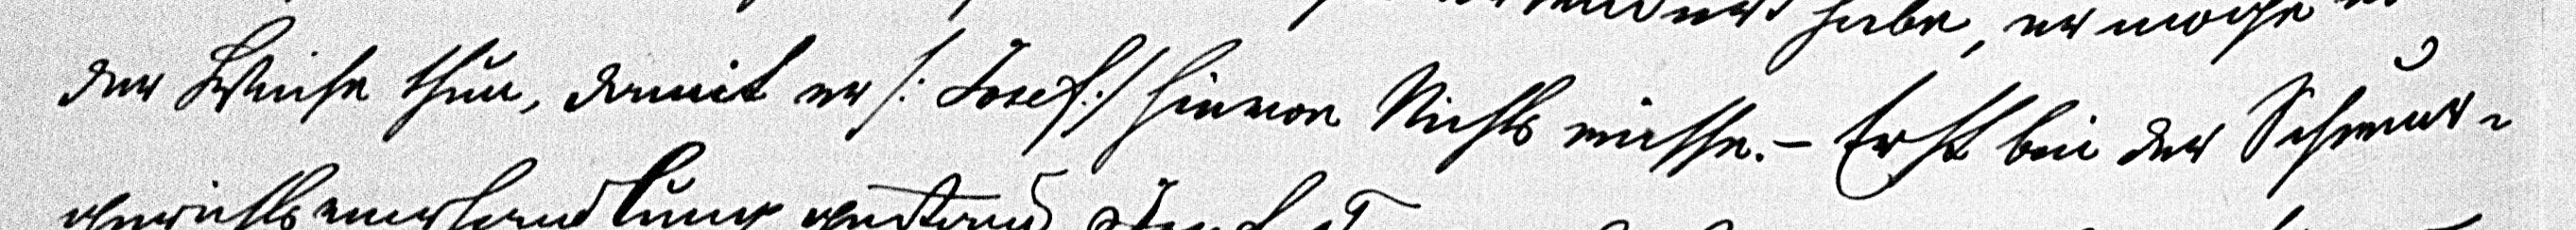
der Weise thun, damit er /:Josef:/ hievon Nichts müsse.- Erst bei der Schwur¬
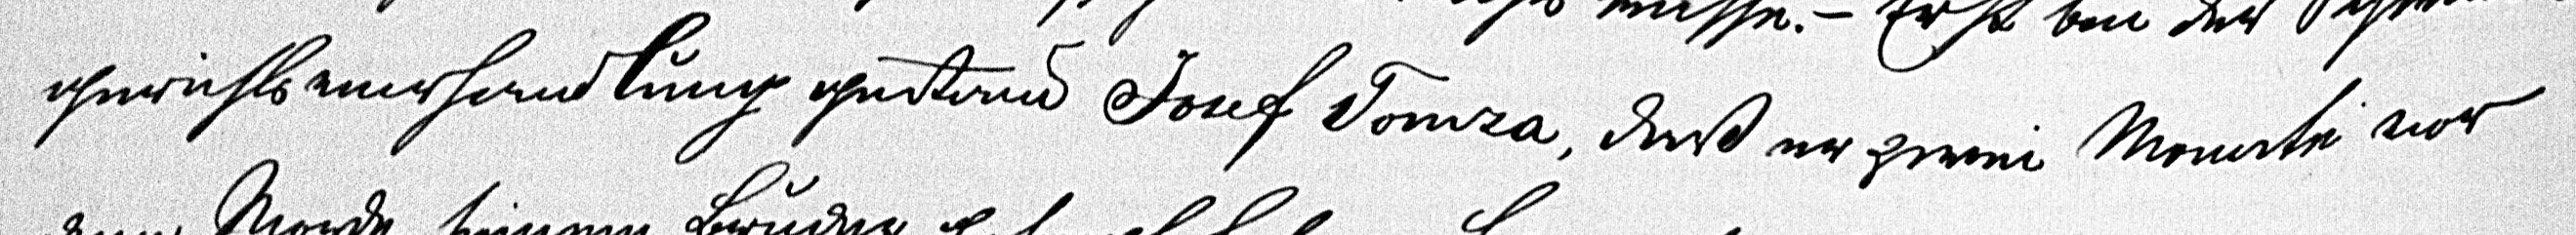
gerichtsverhandlung gestand Josef Tomza, daß er zwei Monate vor
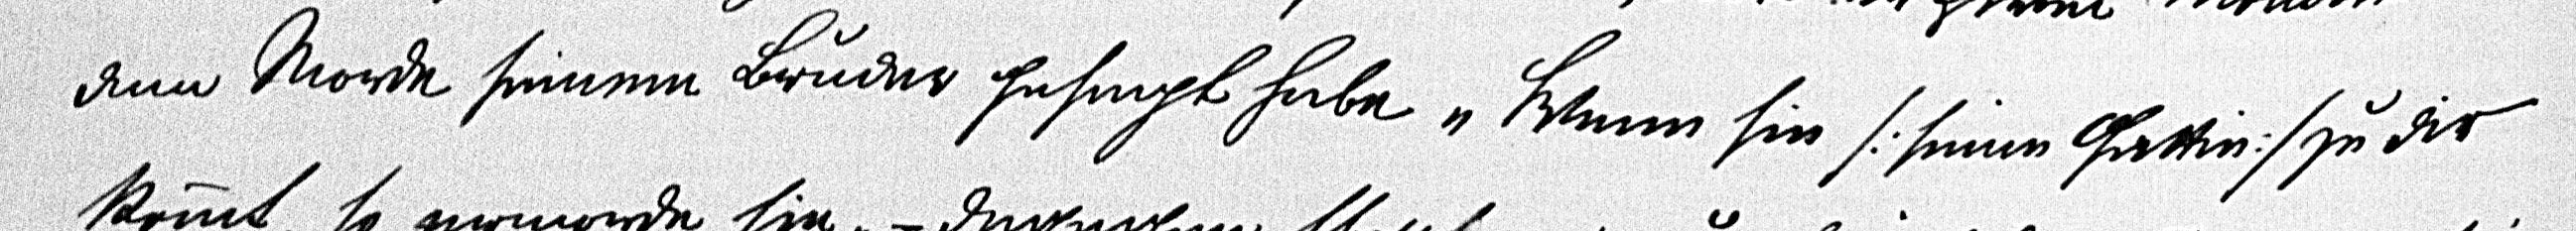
dem Morde seinem Bruder gesagt habe „Wenn sie /:seine Gattin:/ zu die
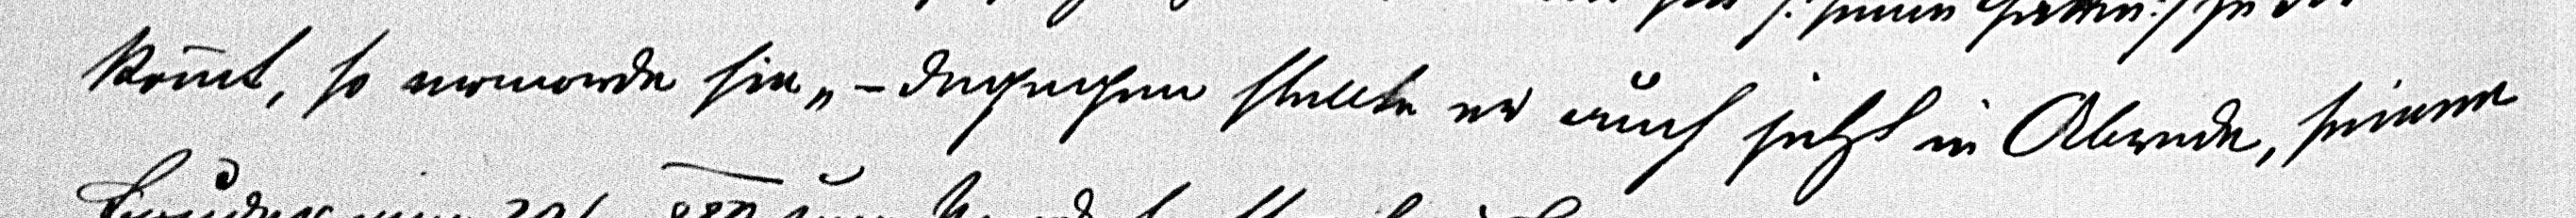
kommt, so ermorde sie„- dagegen stellte er auch sicht in Abrede, seinen
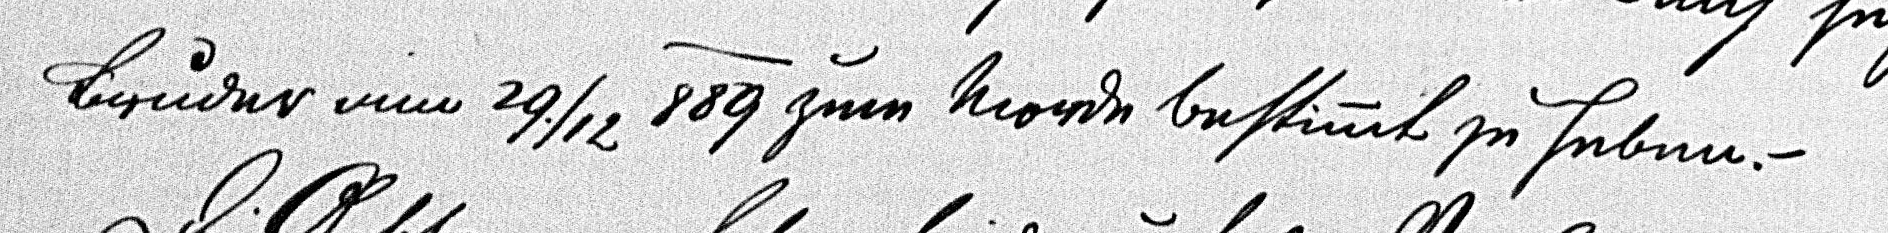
Bruder am 29./12 889 zum Morde bestimmt zu haben.-
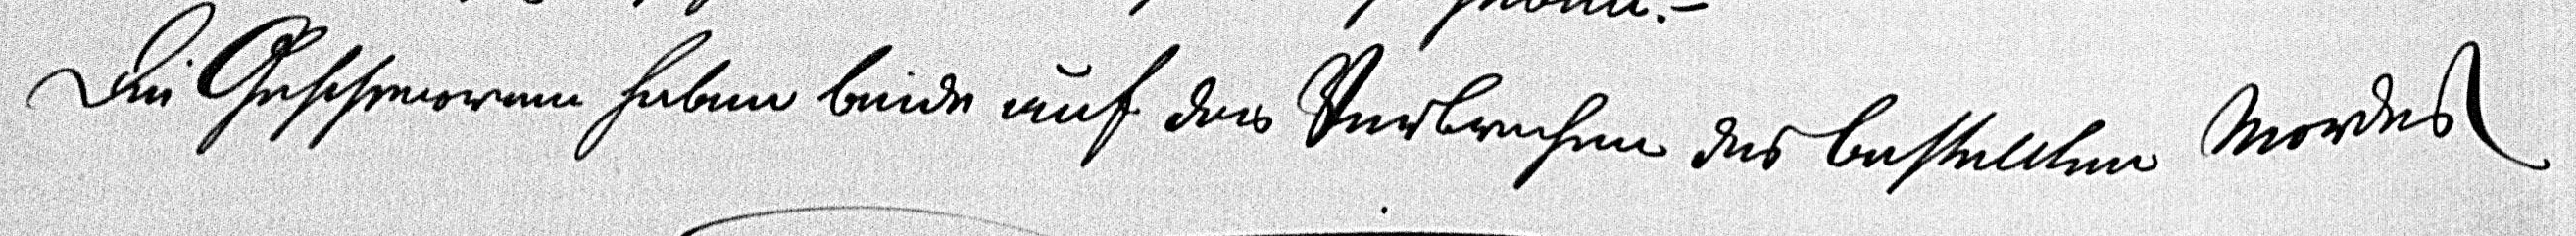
Die Geschwornen haben beide auf der Verbrahen des bestellten Mordes
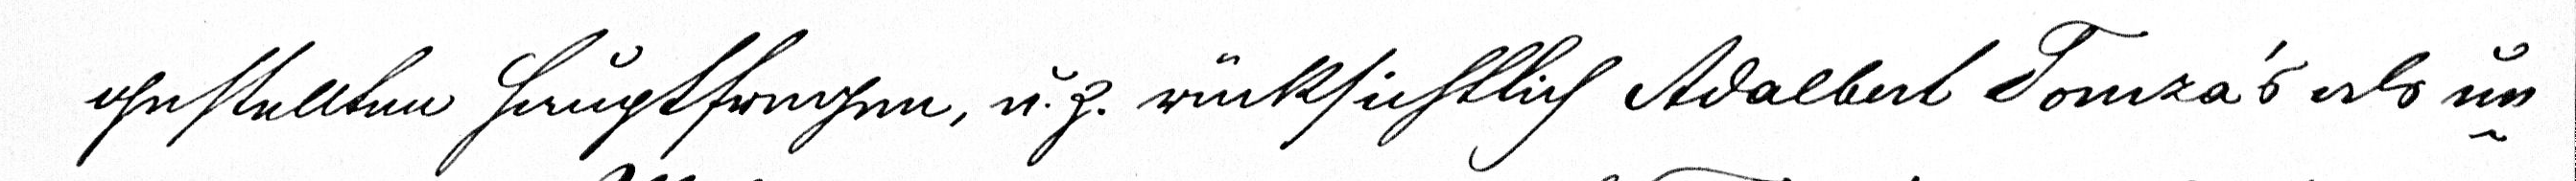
gestellten Hauptfragen, u.z. rücksichtlich Adalbert Tomza’s als un¬
